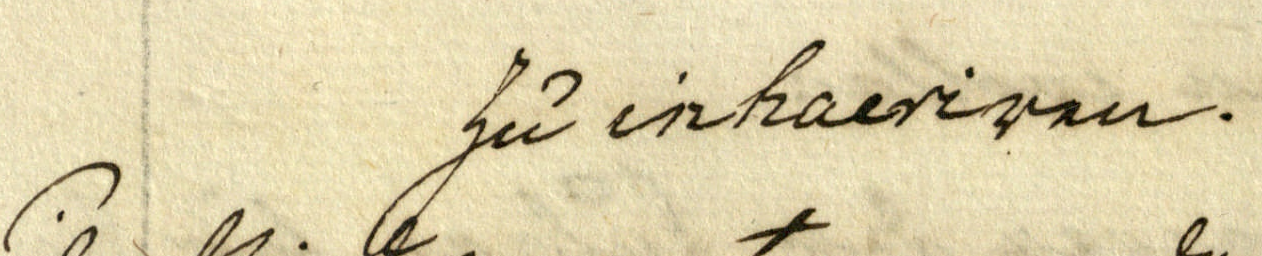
zu inhaeriren.
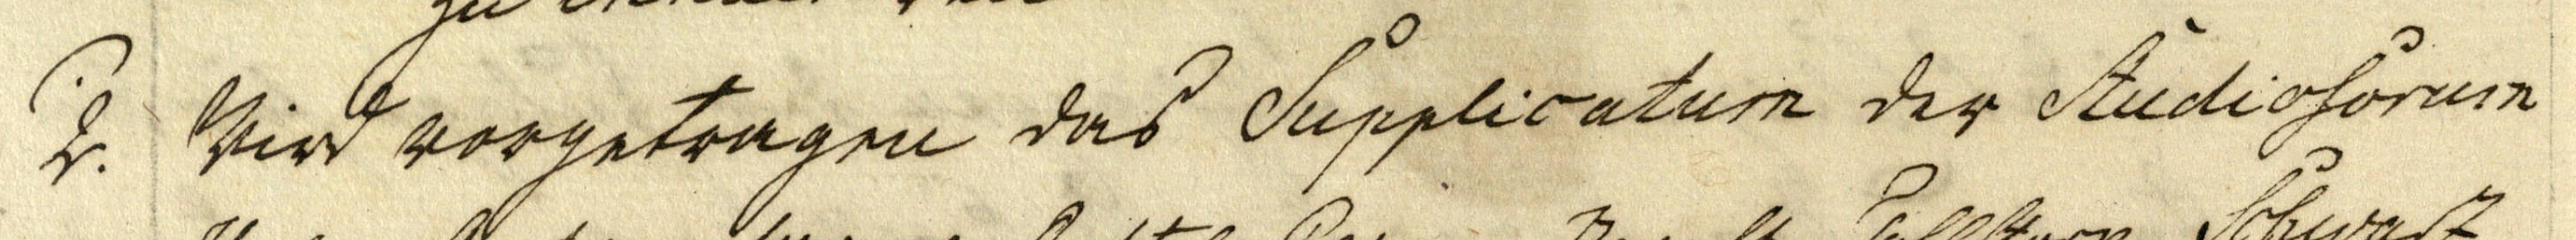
2.) Wird vorgetragen das Supplicatum der Studiosorum
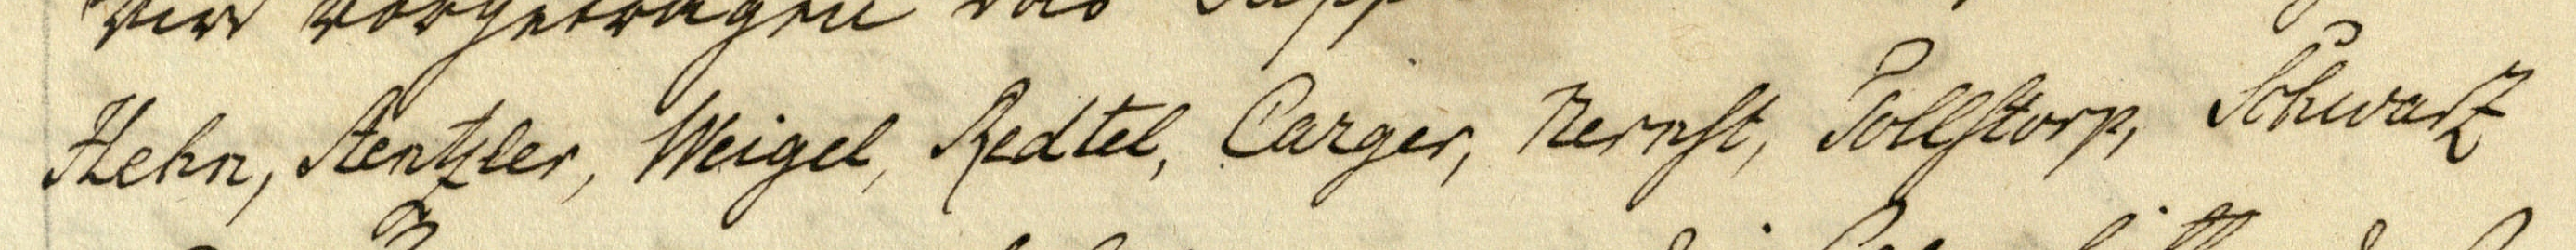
Hehn, Stentzler, Weigel, Redtel, Carger, Nernst, Tollstorp, Schwarz
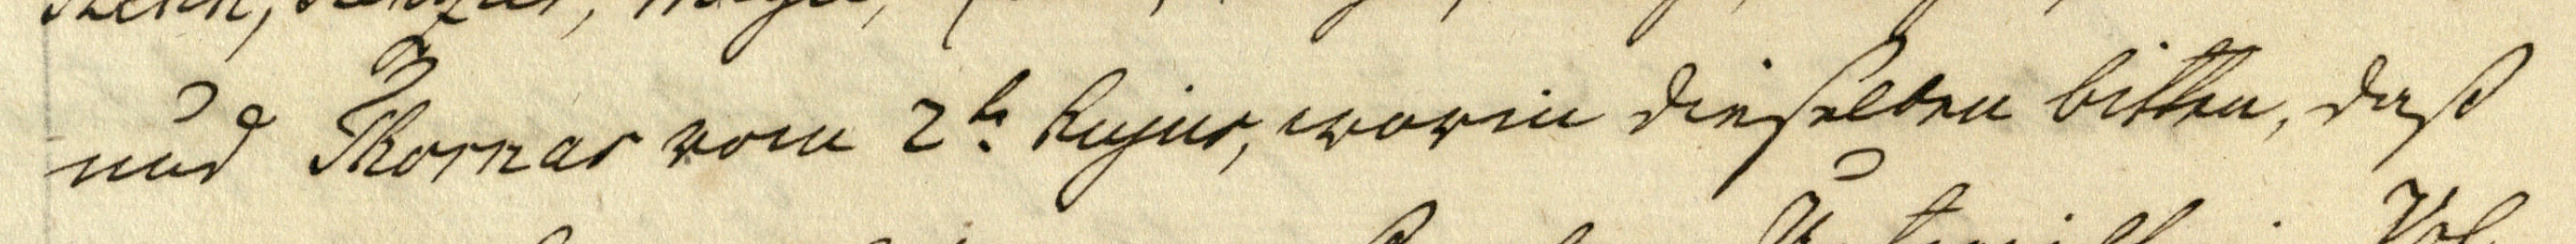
und Thomas vom 2ten hujus, worin dieselben bitten, daß
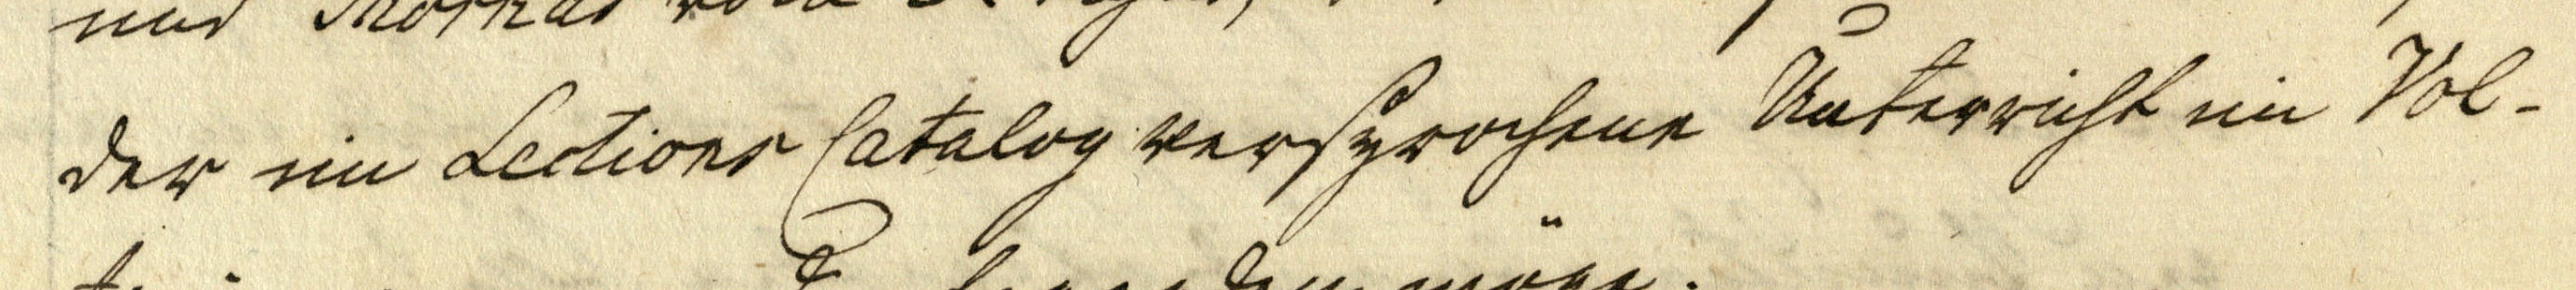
der im Lections Catalog versprochene Unterricht im Vol-
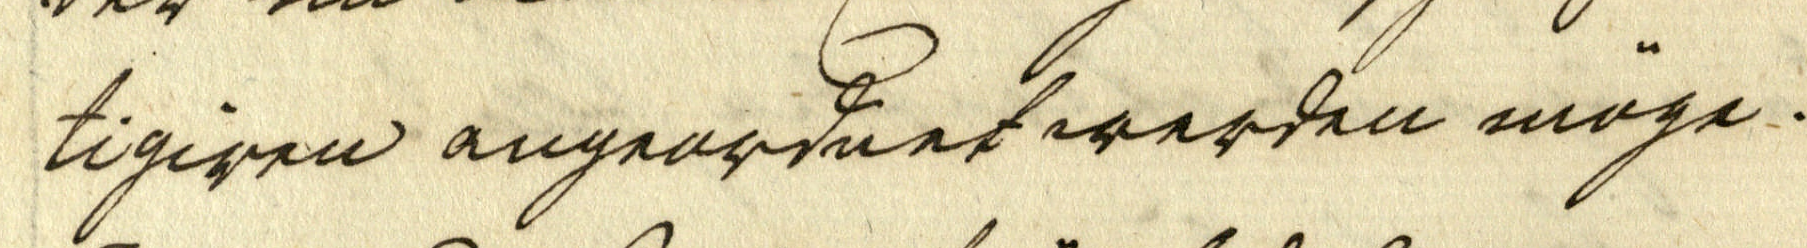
tigiren angeordnet werden möge.
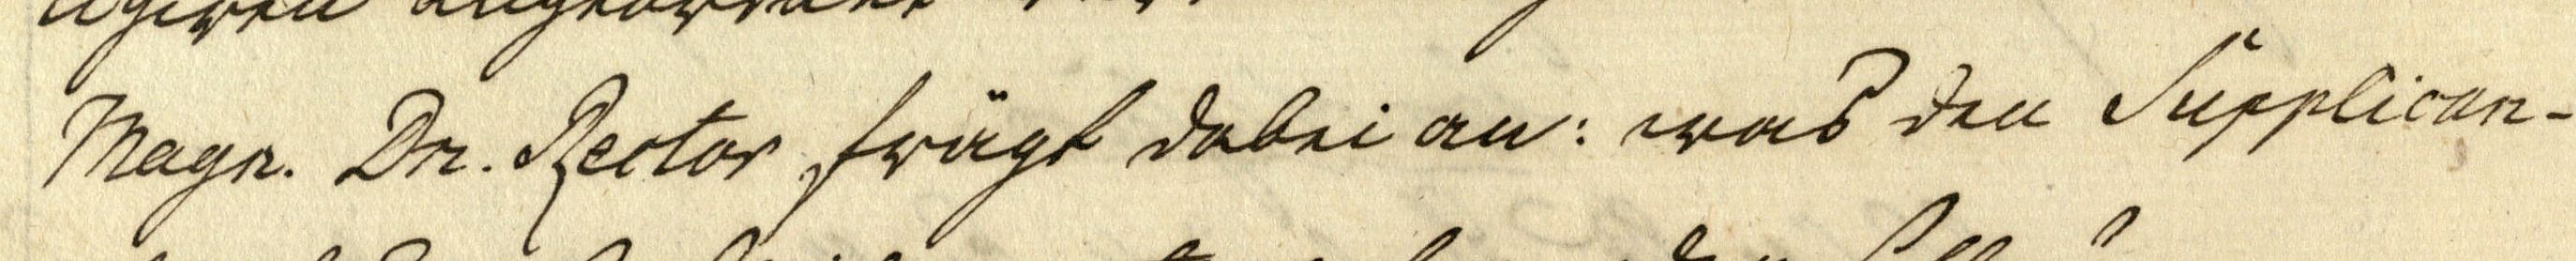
Magn. dn. Rector frägt dabei an: was den Supplican-
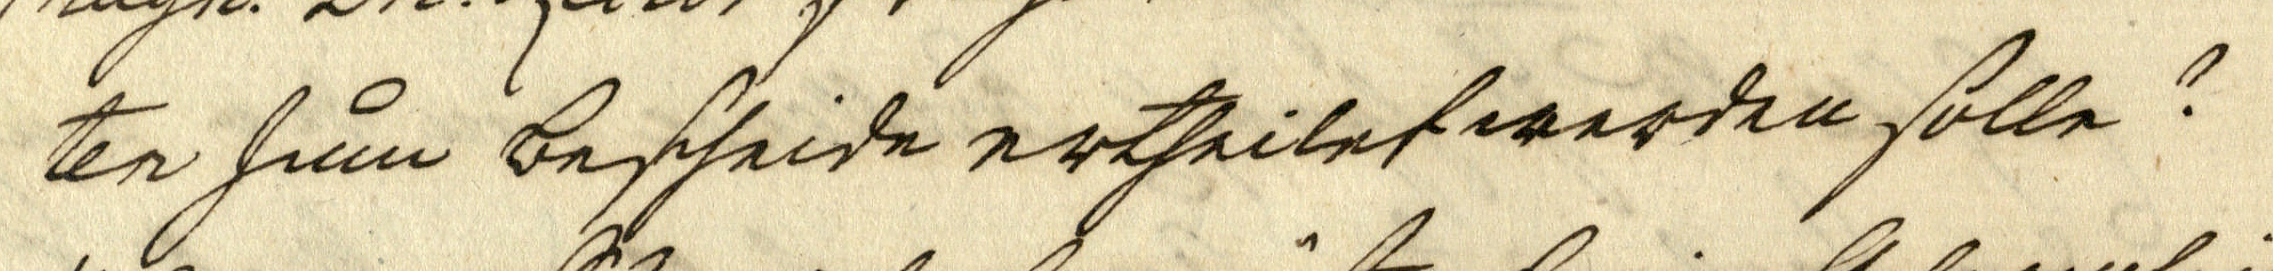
ten zum Beschiede ertheilet werden solle?
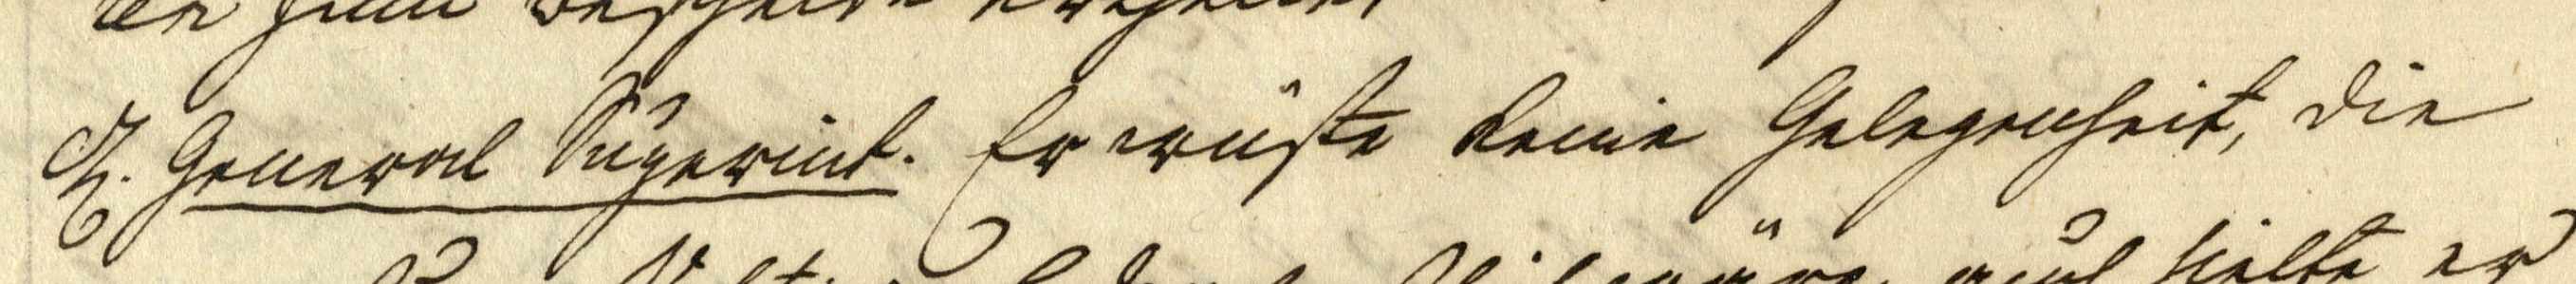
dh. General Superint. Er wüste keine Gelegenehit, die
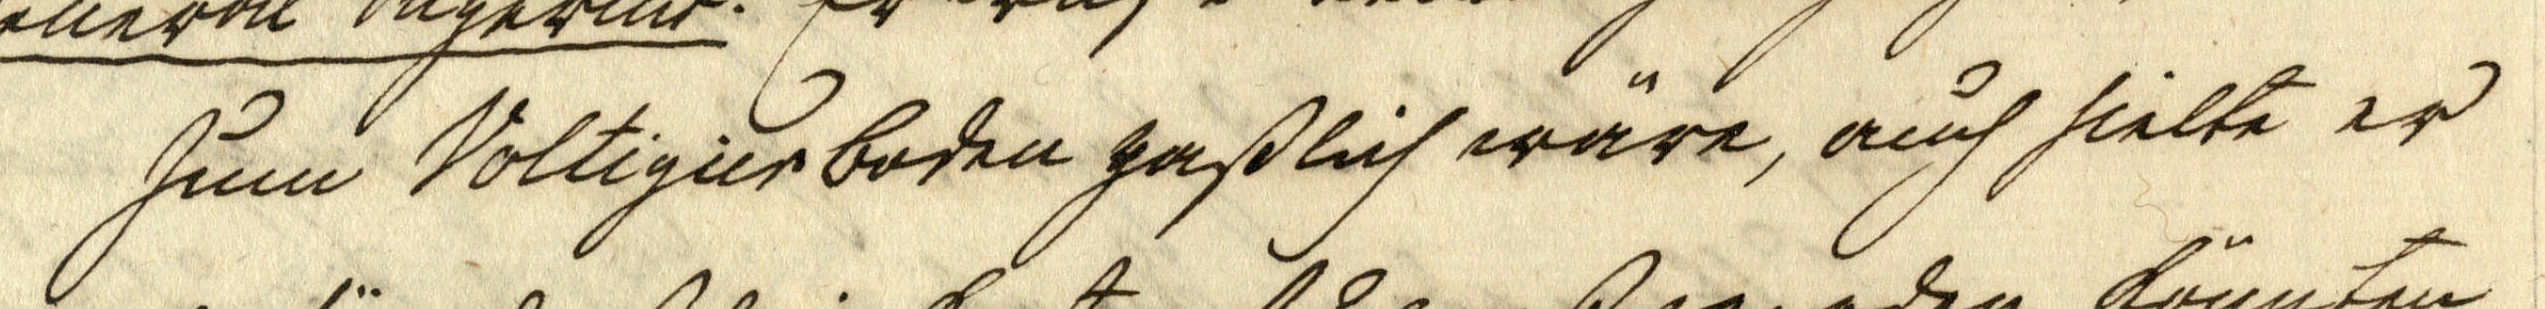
zum Voltigierboden paßlich wäre, auch hielte er
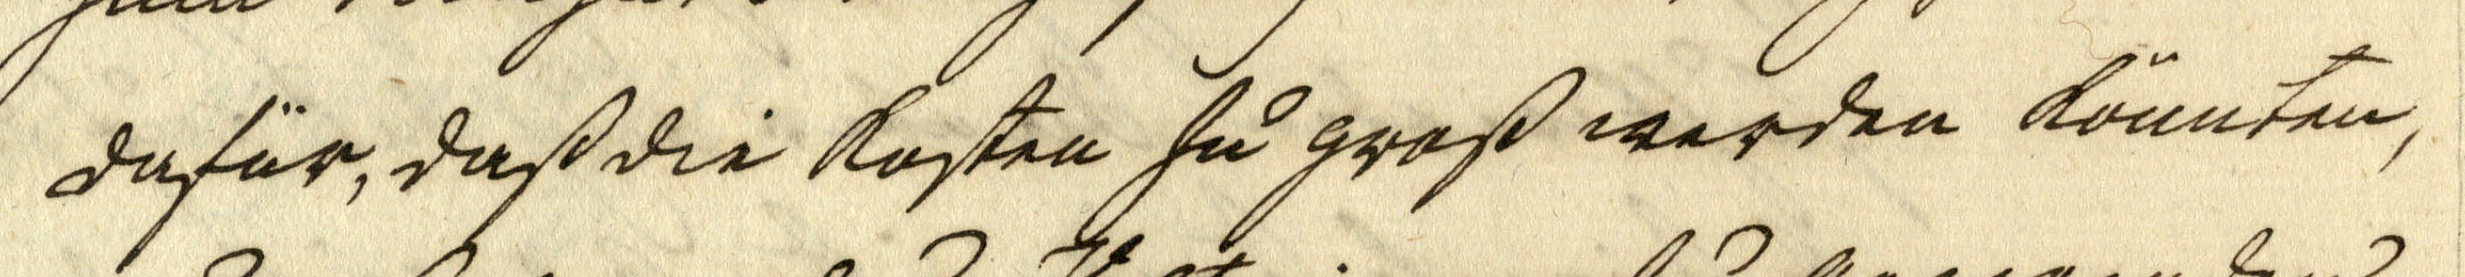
dafür, daß die Kosten zu groß werden könnten,
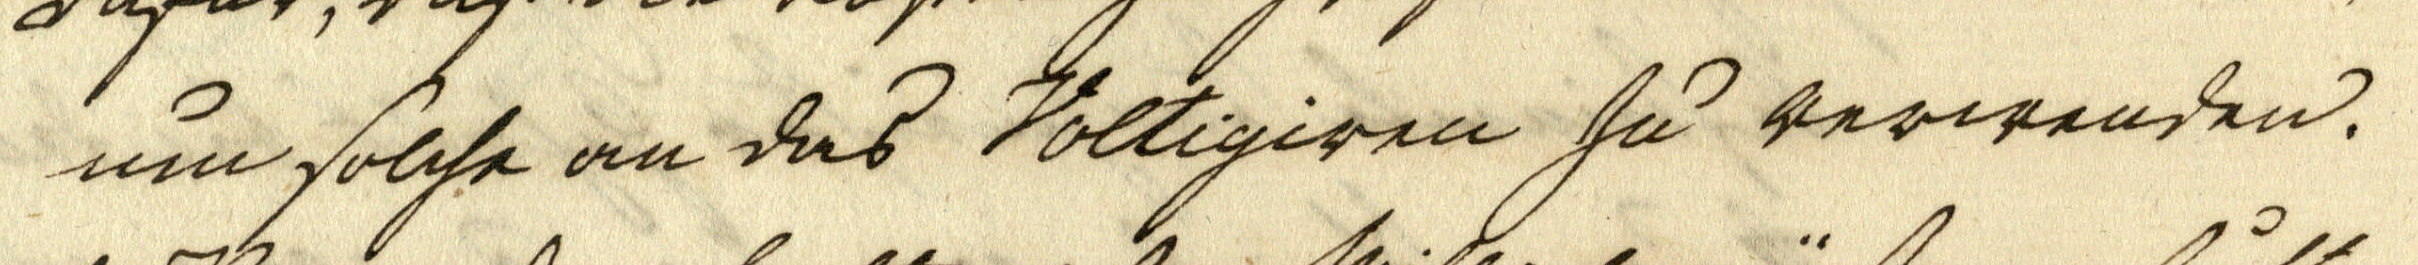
um solche an das Voltigiren zu verwenden.
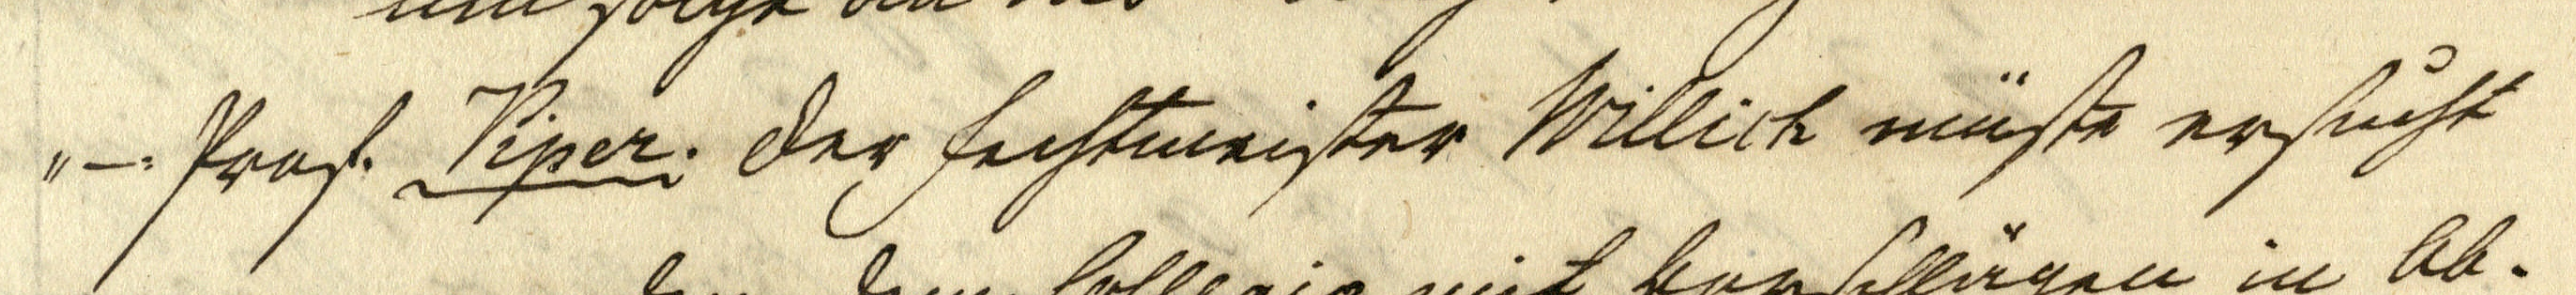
" - " Prof. Piper. Der Fechtmeister Willich müßte ersucht
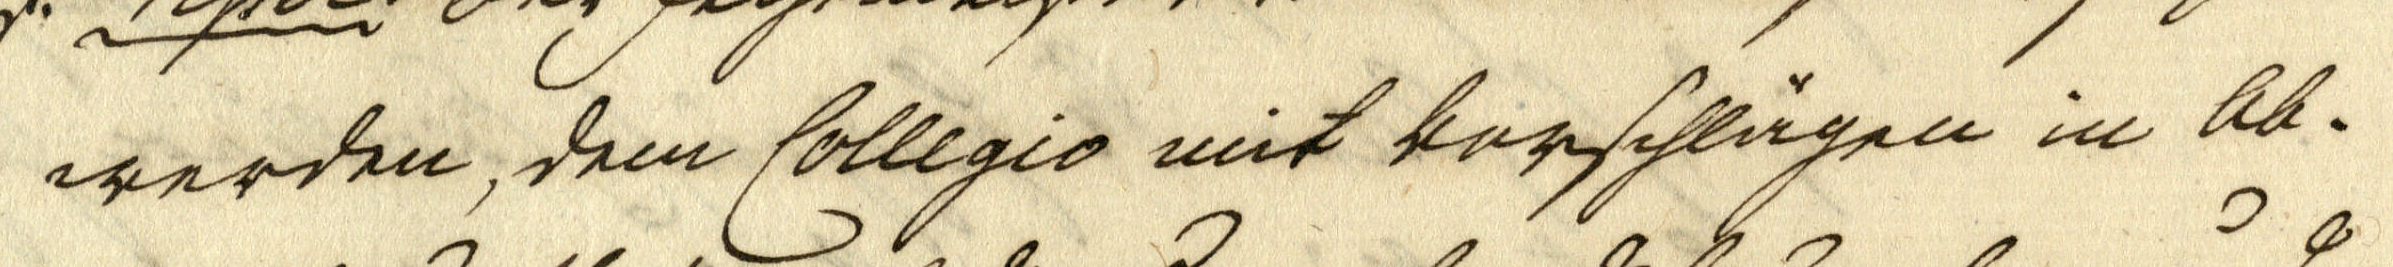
werden, dem Collegio mit Vorschlägen in Ab-
